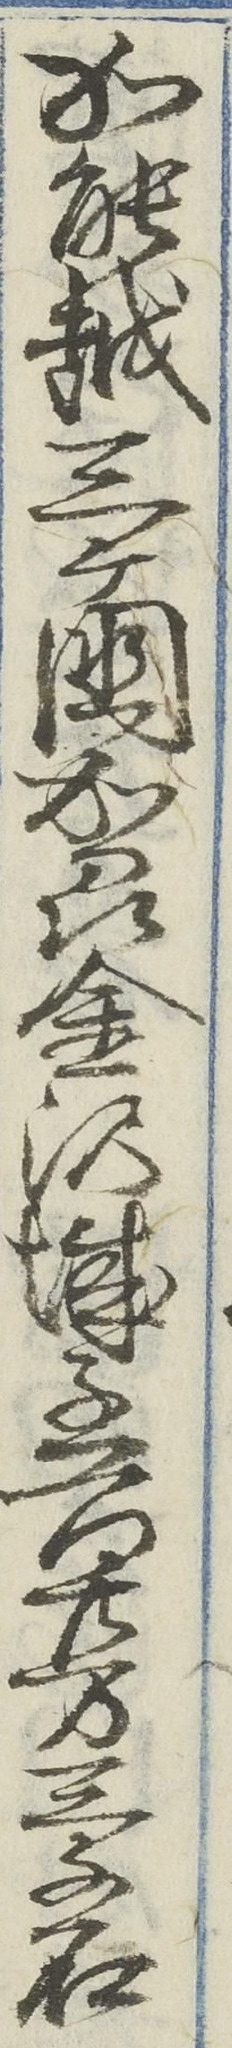加能越三ケ国加州金沢城主二百廿万三千石
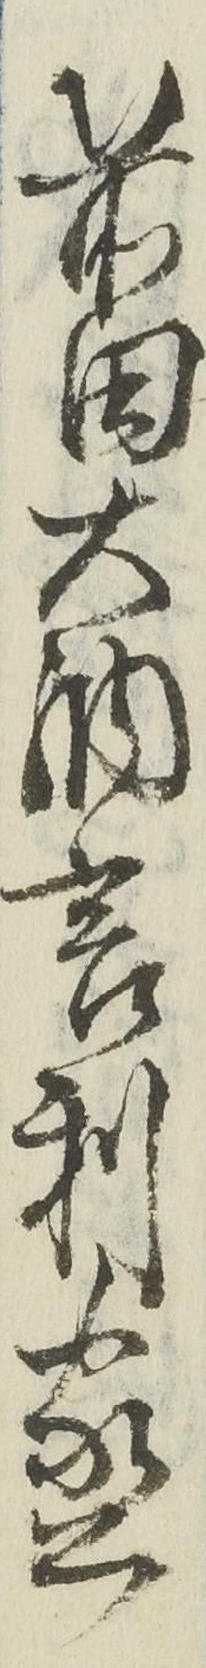前田大納言利家公
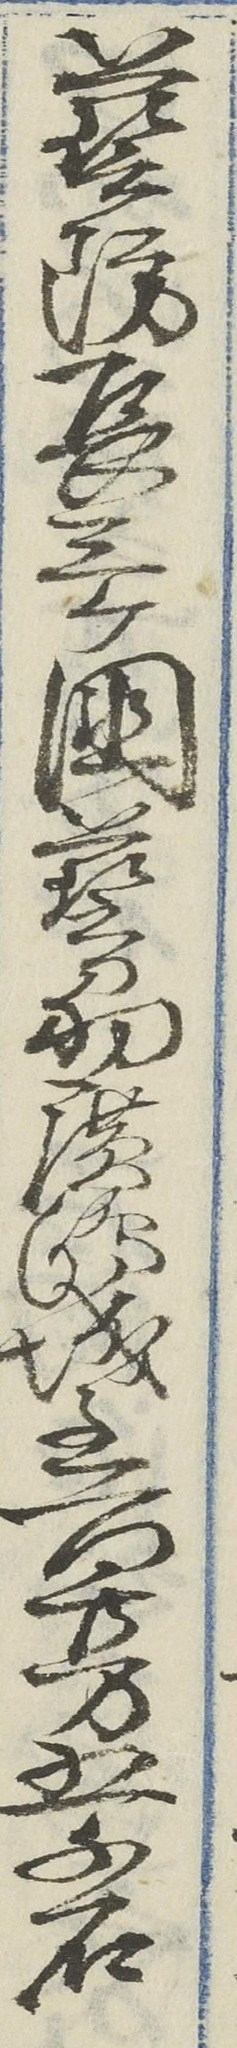芸防長三ケ国芸州広島城主二百廿万五千石
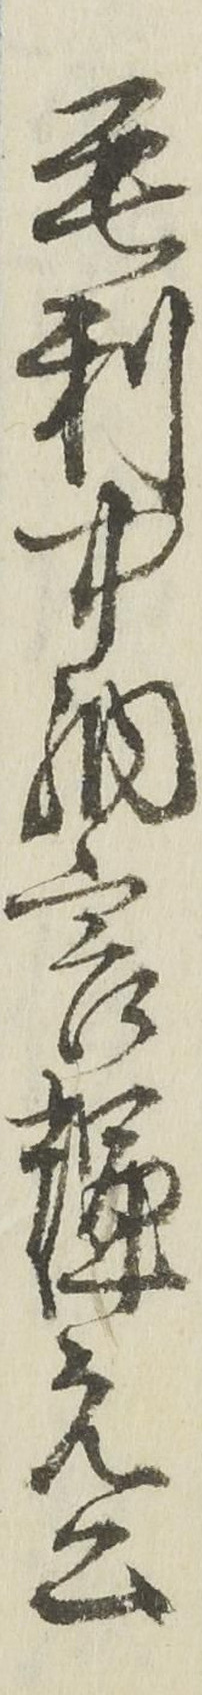毛利中納言輝元公
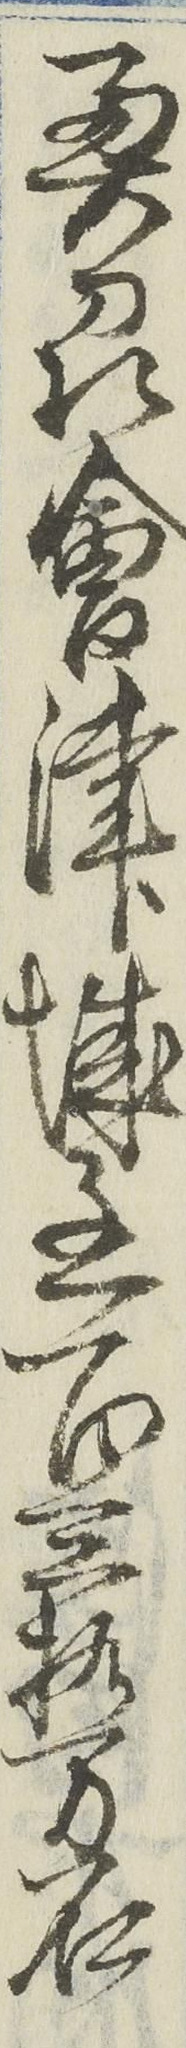奥州会津城主百三拾万石
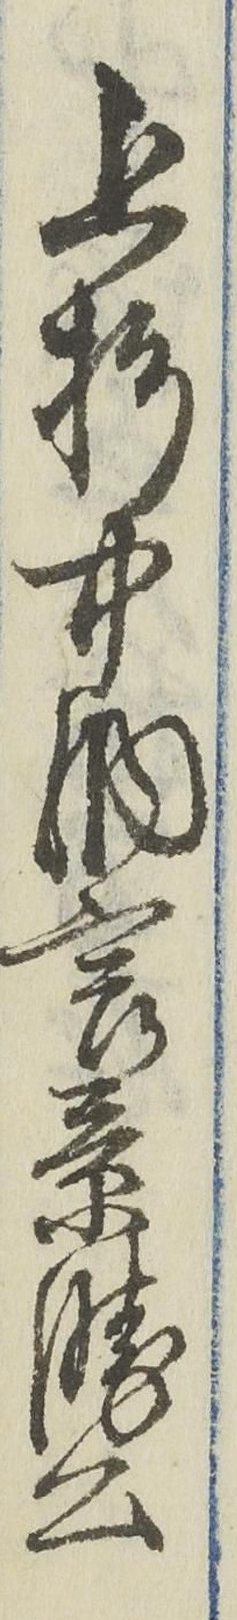上杉中納言景勝公

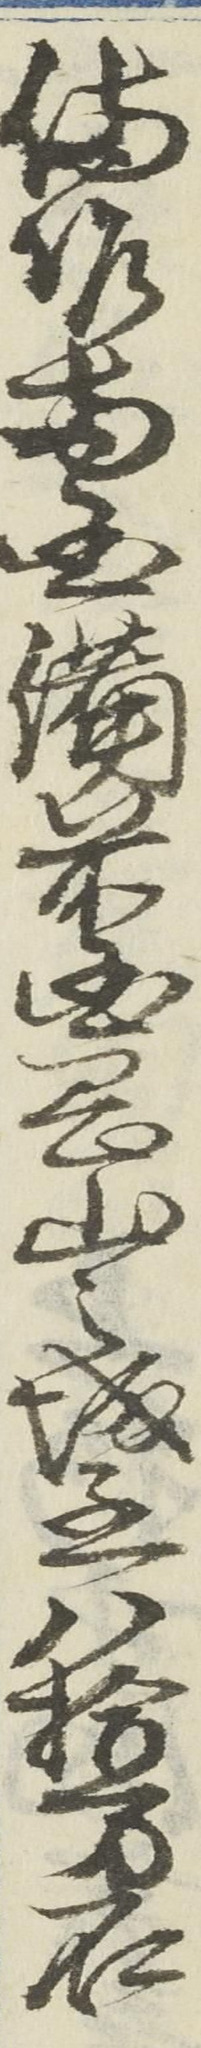備作両国備前国岡山之城主八拾万石
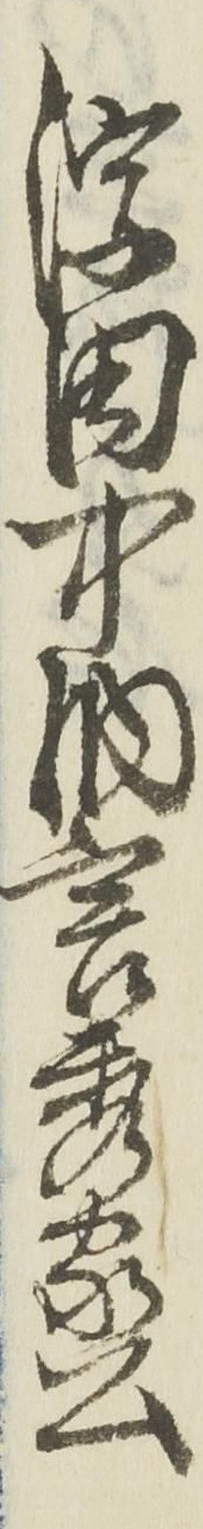浮田中納言秀家公
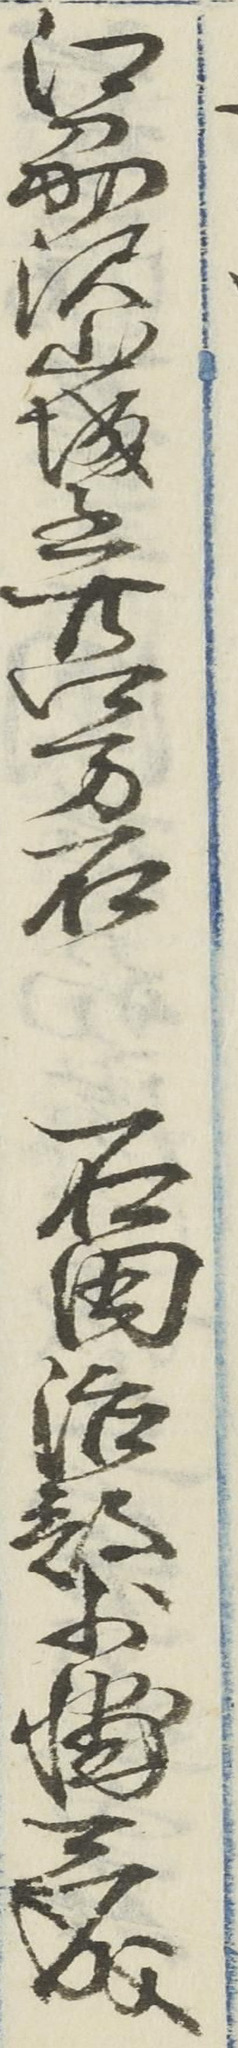江州沢山城主廿四万石石田治部少輔三成
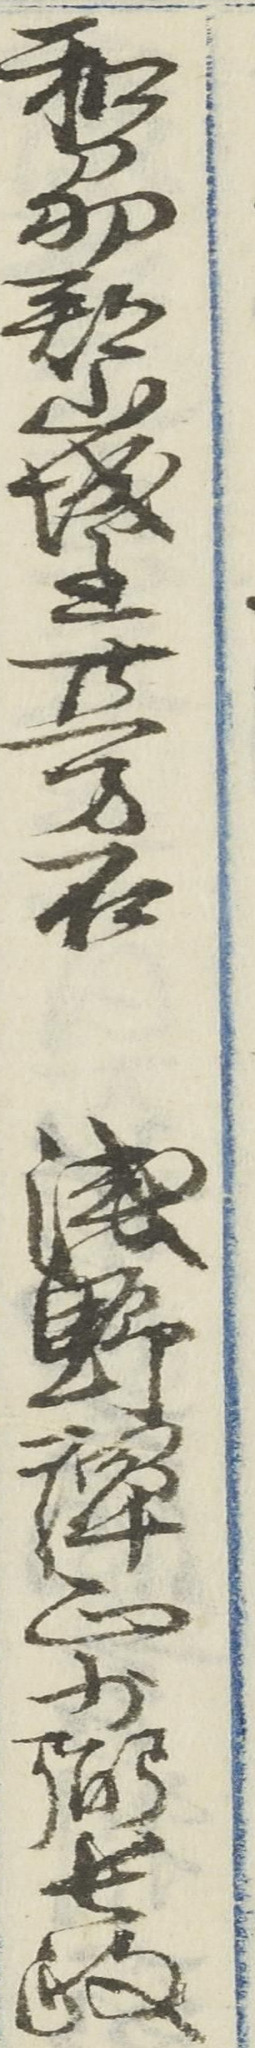和州郡山城主廿一万石浅野弾正少弼長政
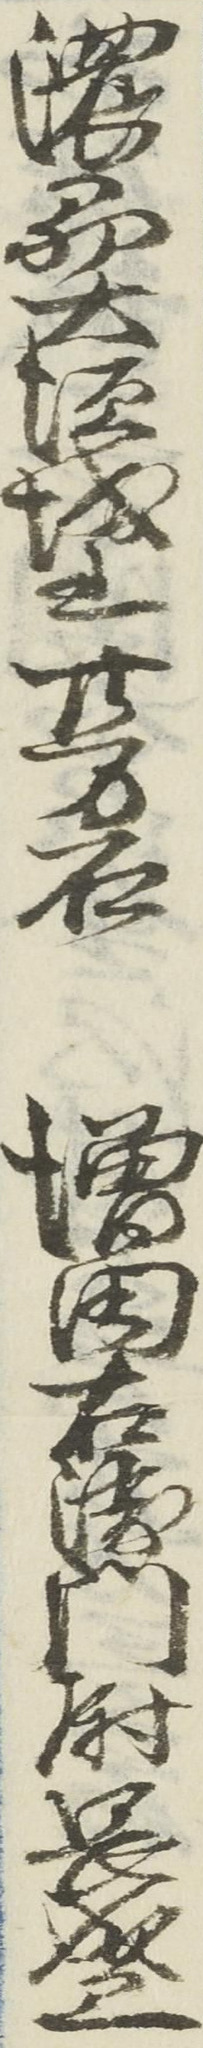濃州大垣城主廿万石増田右衛門尉長盛
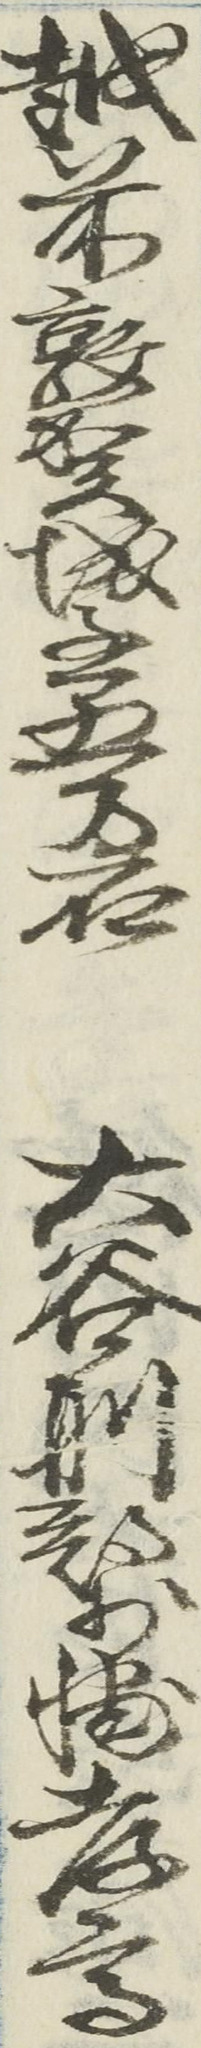越前敦賀城主五万石大谷刑部少輔孝高
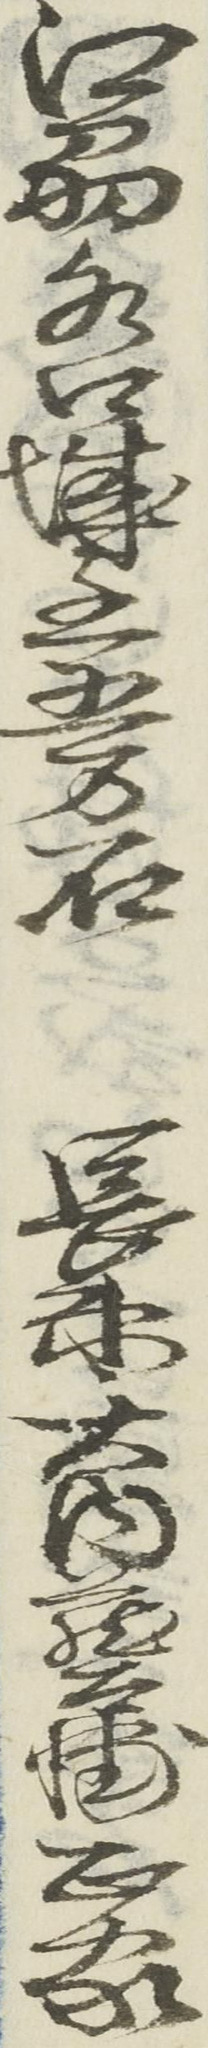江州水口城主五万石長束大内蔵太輔正家
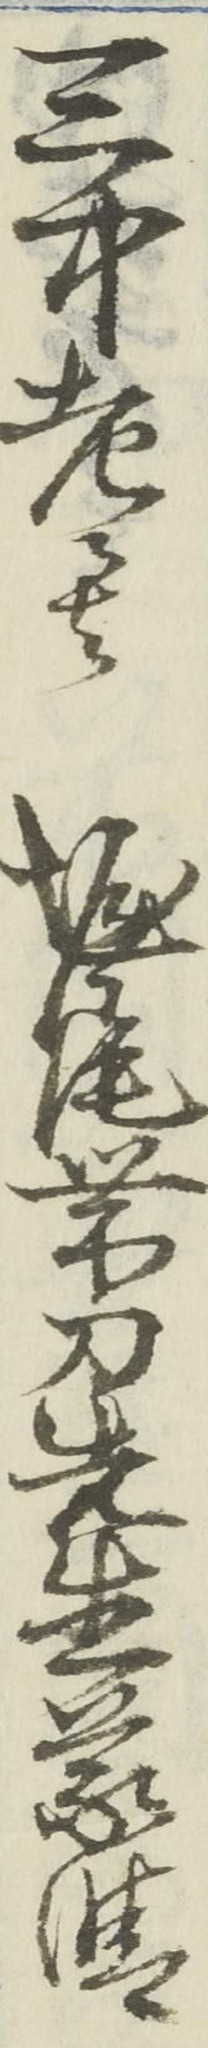三中老ニは堀尾帯刀先生義晴
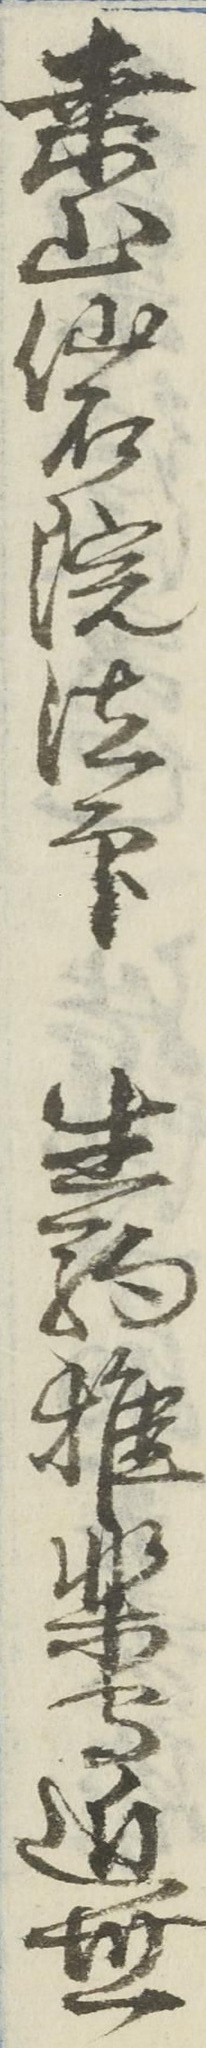桑山仙石院法印生駒雅樂守近世
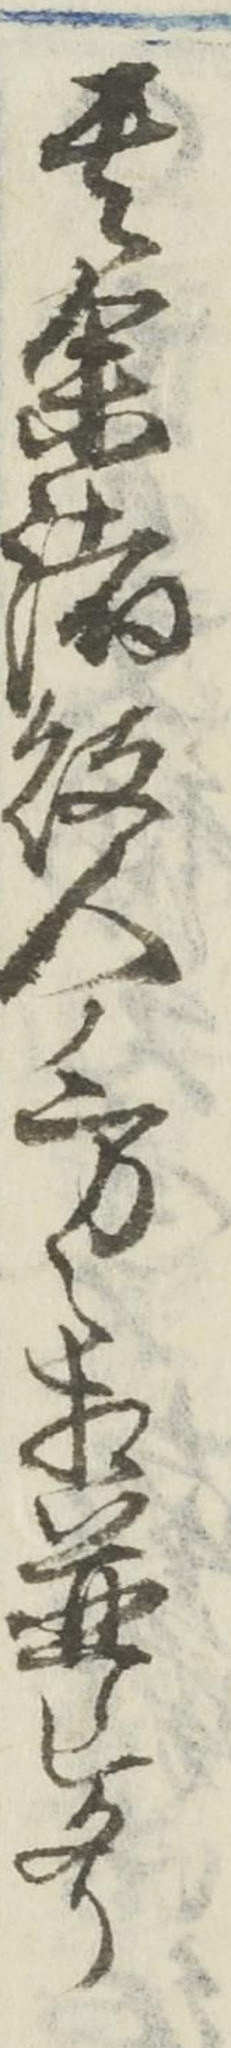其余諸役人ノ方之相並ヒタリ
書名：伏水大地震
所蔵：東京大学地震研究所図書室 Earthquake Research Institute Library, The University of Tokyo, JAPAN
